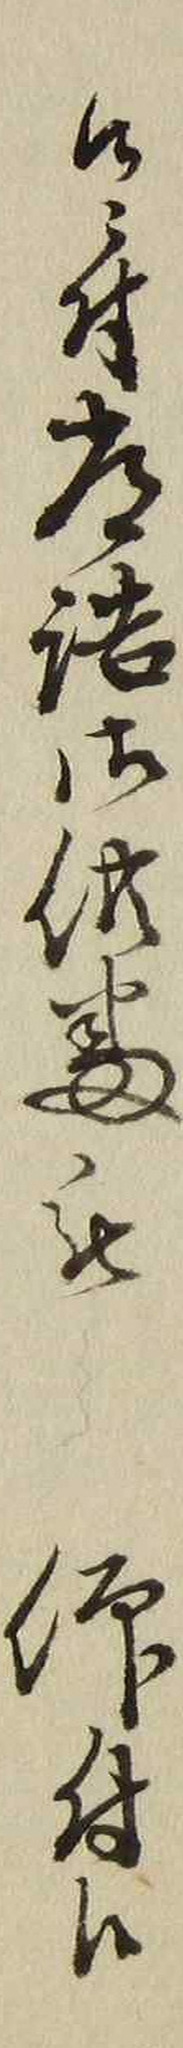候ニ付常詰御供番被仰付候
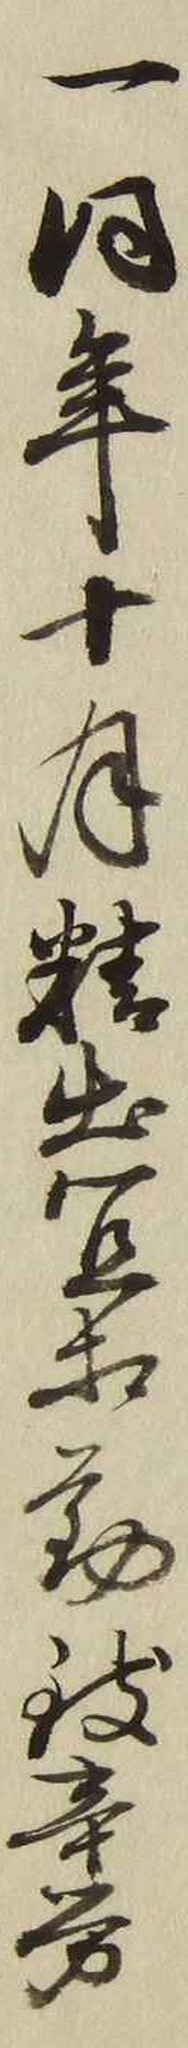一同年十月精出宜相勤致辛労

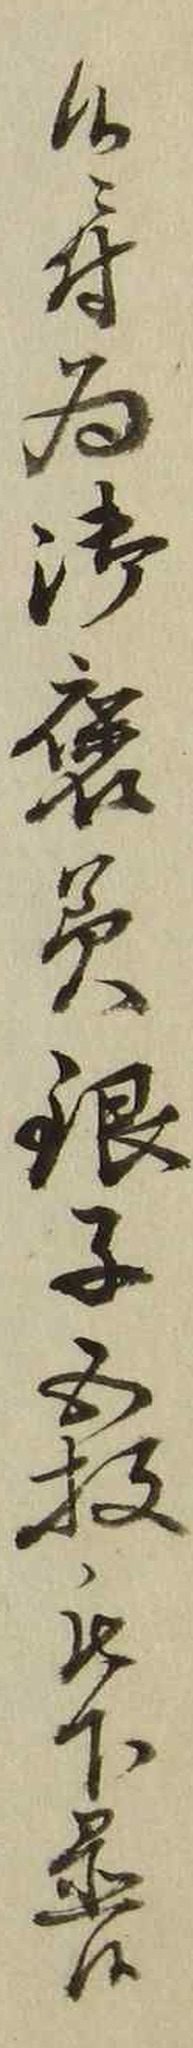候ニ付為御褒美銀子五枚被下置候
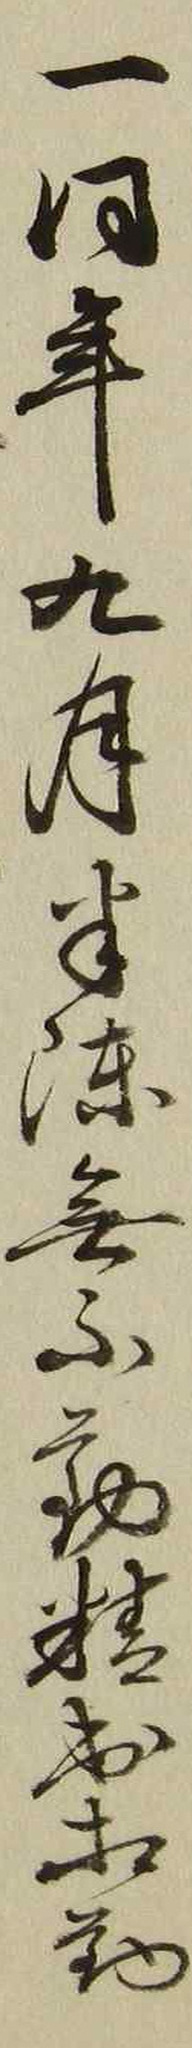一同年九月半陣無不勤精出相勤
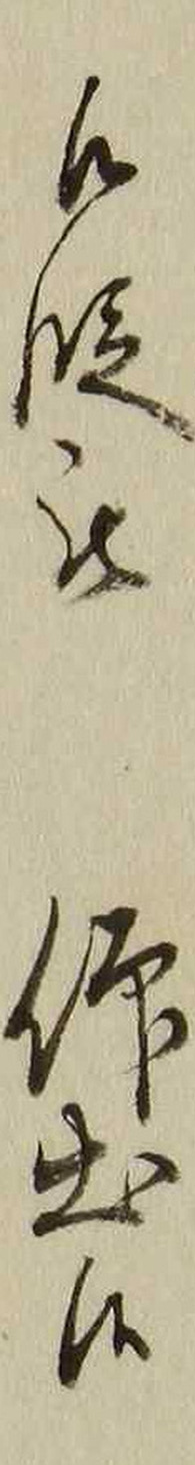候段被仰出候
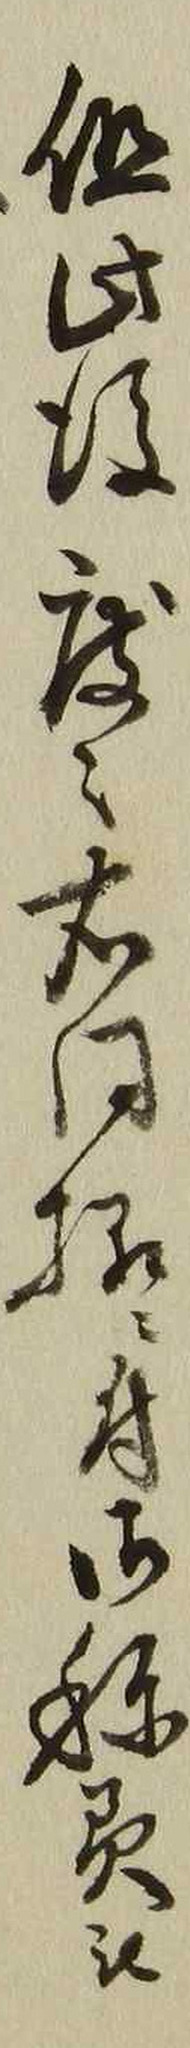但此後度々右同様ニ付御称美被
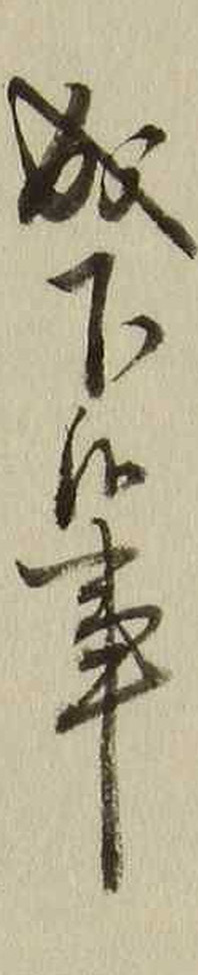成下候事
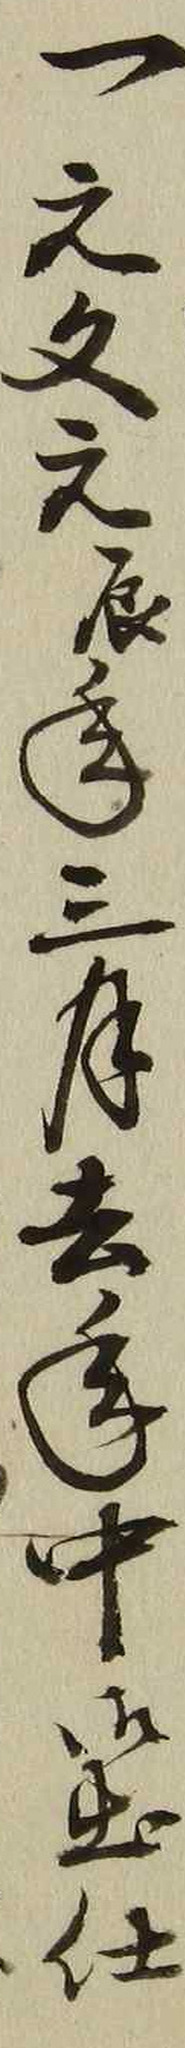一元文元辰年三月去年中御出仕
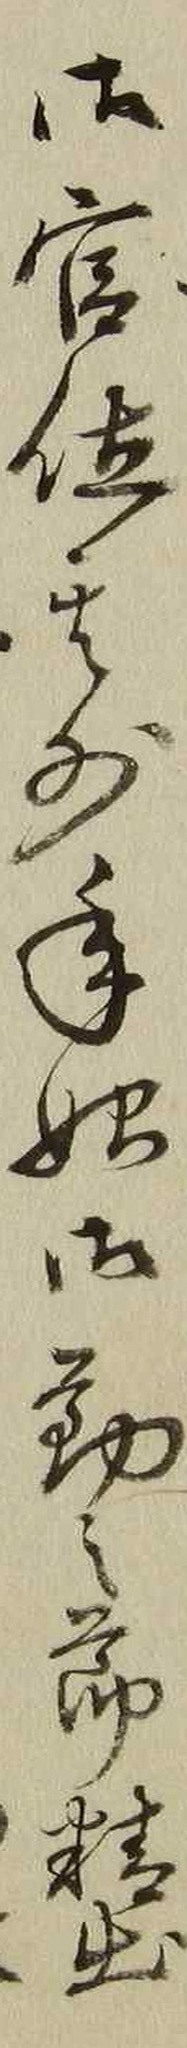御官位其外年始御勤之節精出
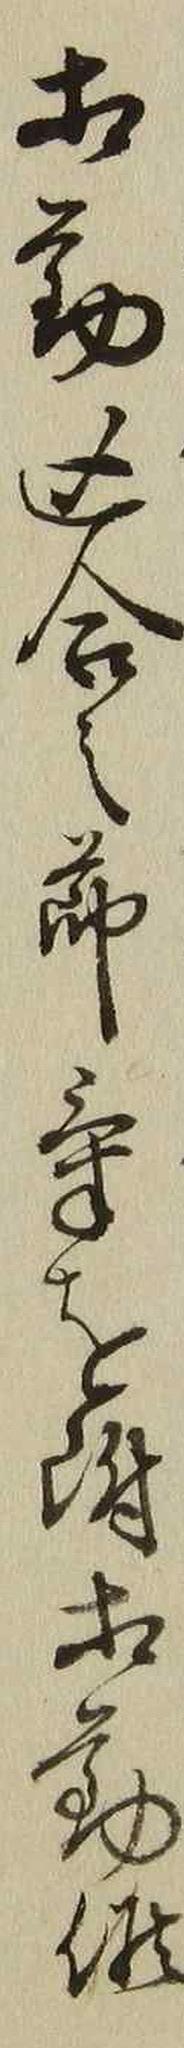相勤込合之節気を附相勤候
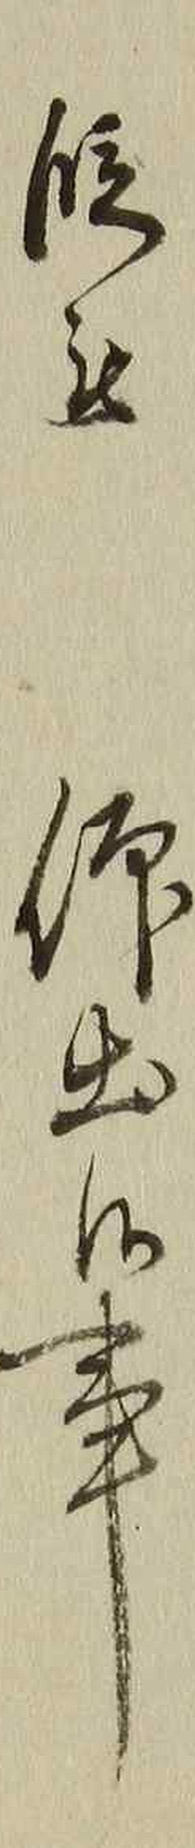段被仰出候事
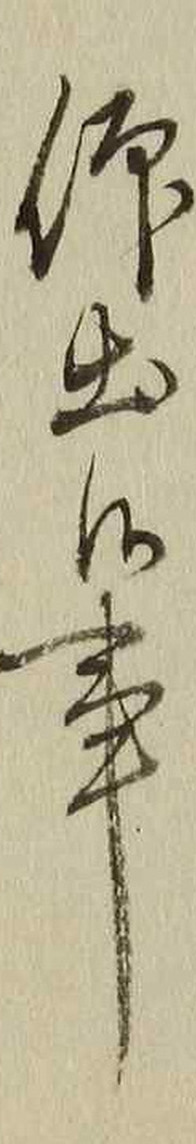仰付候事
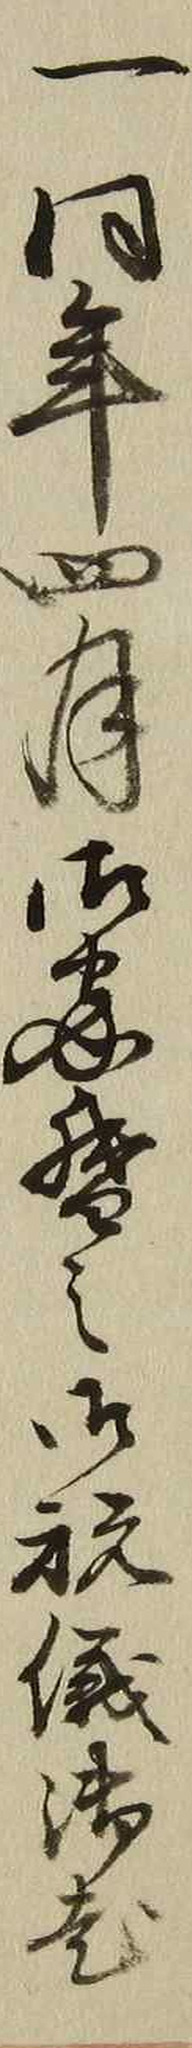一同年四月御家督之御祝儀御老
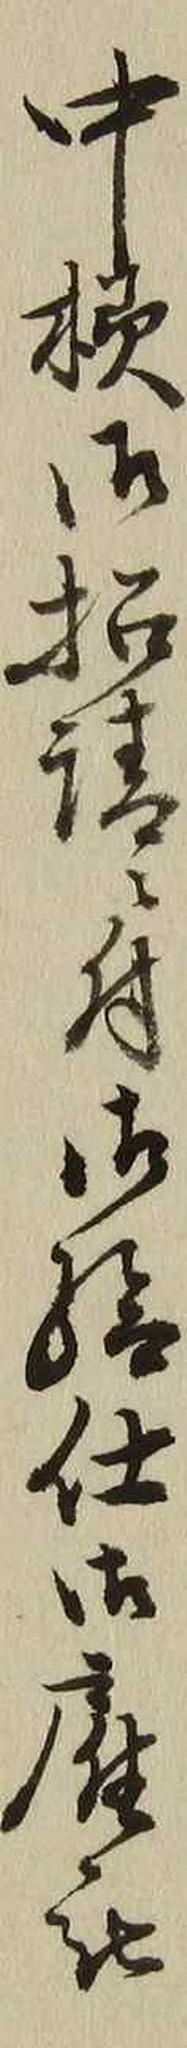中様御招請ニ付御給仕御雇被
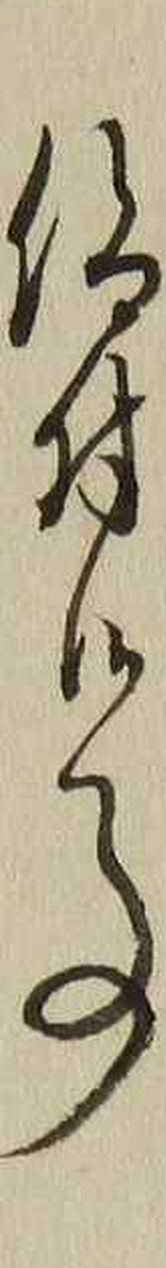仰付候事
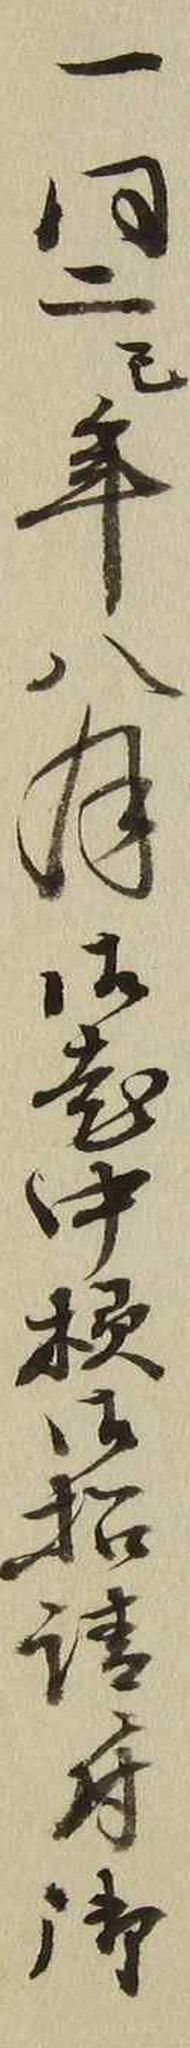一同二巳年八月御老中様御招請ニ付御
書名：諸士系譜　巻之35　は之部3
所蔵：会津若松市立会津図書館
